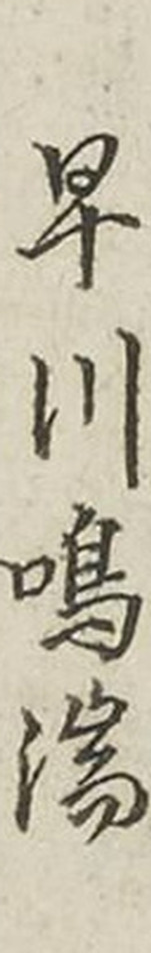早川鳴？
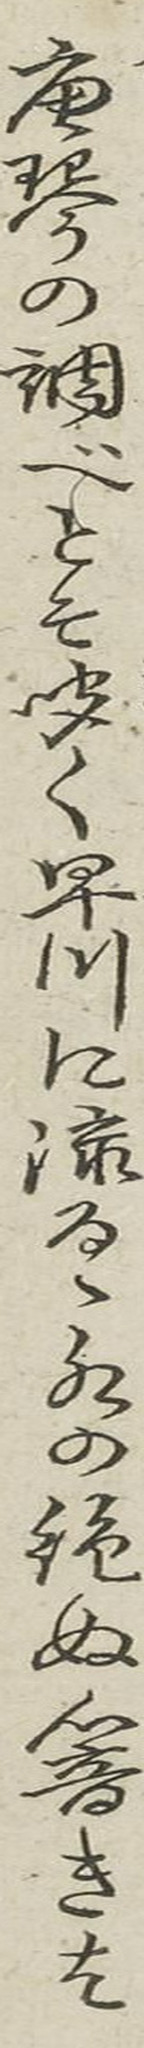唐琴の調べとそ聞く早川に流るゝ水の絶ぬ響きは

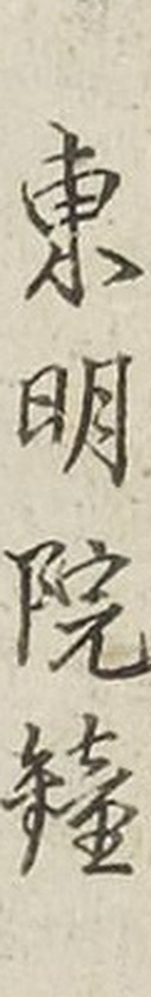東明院鐘
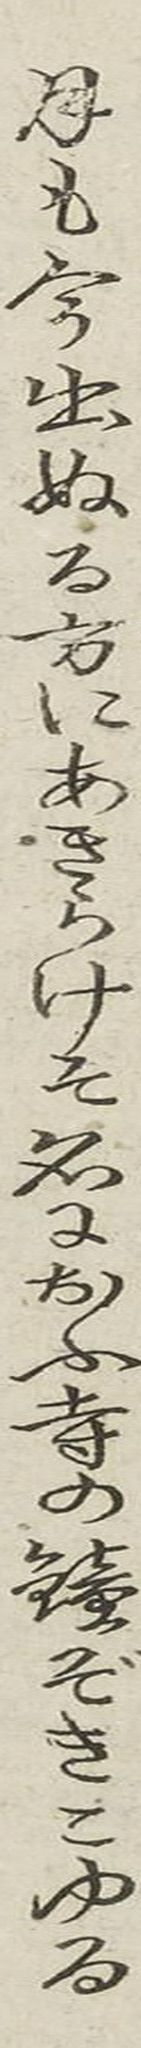月も今出ぬる方にあきらけそ名におふ寺の鐘ぞきこゆる
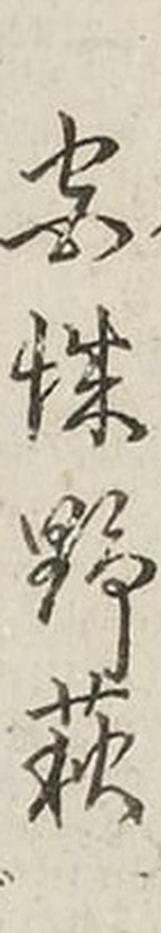宮城野萩
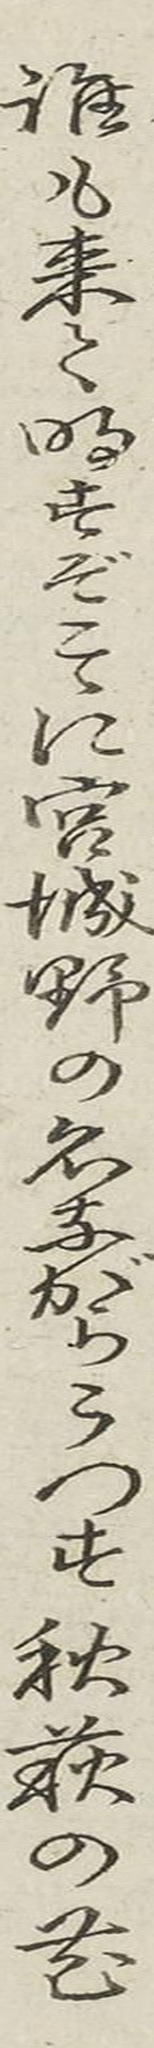誰も来て明すぞこゝに宮城野の名ながらうつす秋萩の花
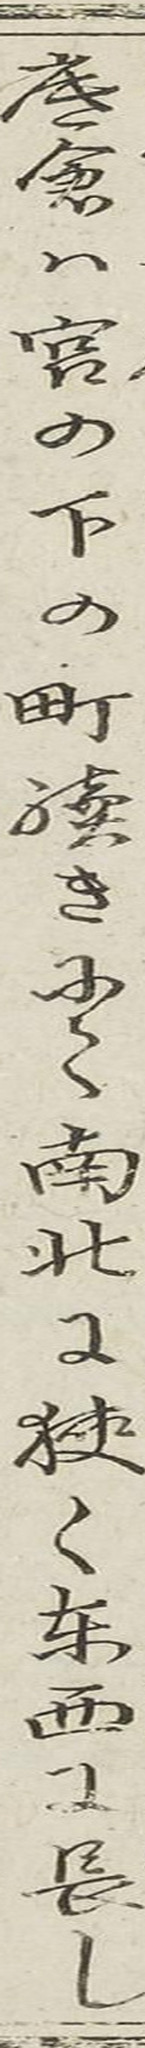底倉は宮の下の町續きにて南北に狭く東西に長し
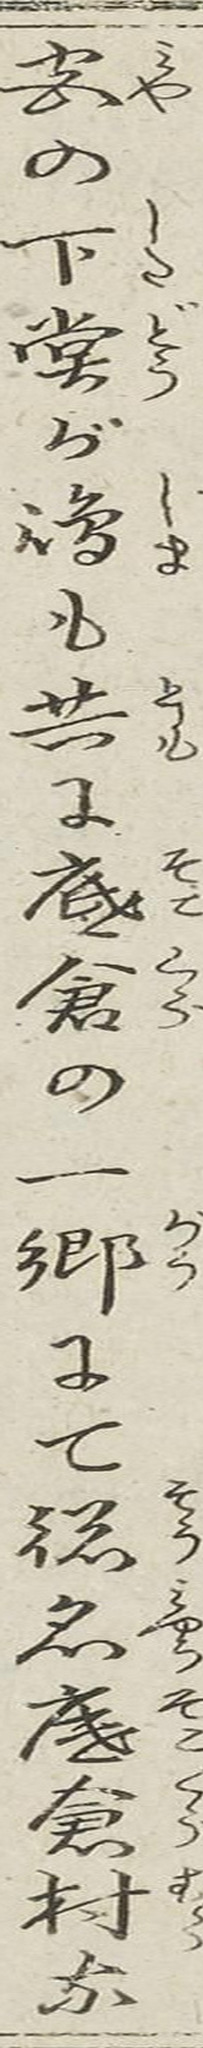宮の下堂が嶋も共に底倉の一郷にて総名底倉村な
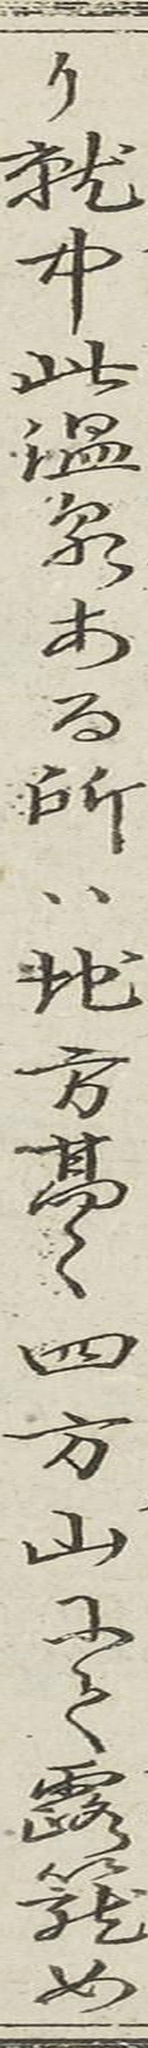り就中此温泉ある所は地方高く四方山にて露蔵め
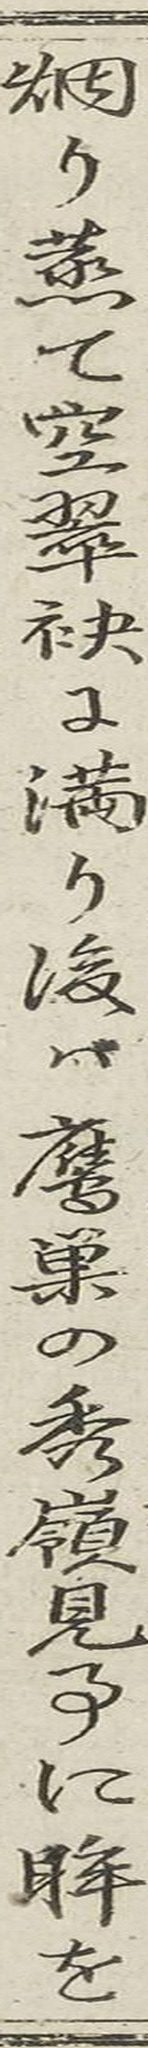烟り蒸て空翠袂に満り後は鷹巣の秀嶺見事に眸を
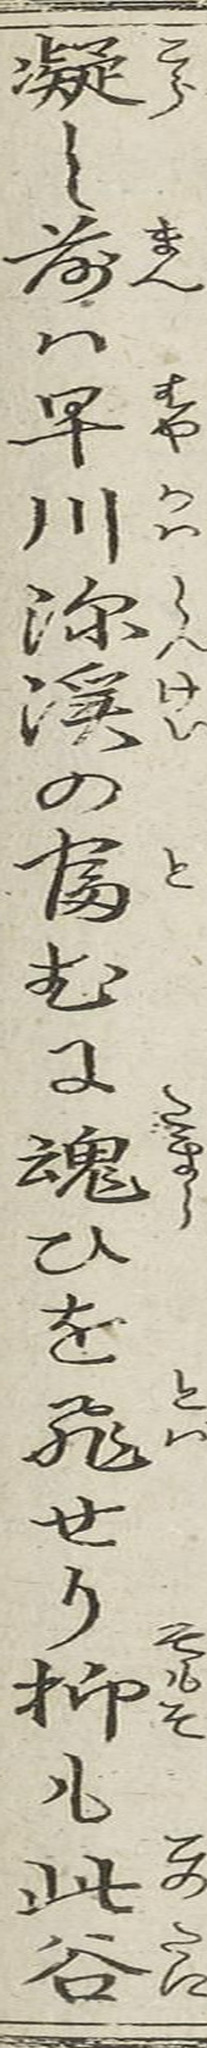凝し前は早川深溪の富むに魂ひを飛せり抑も此谷
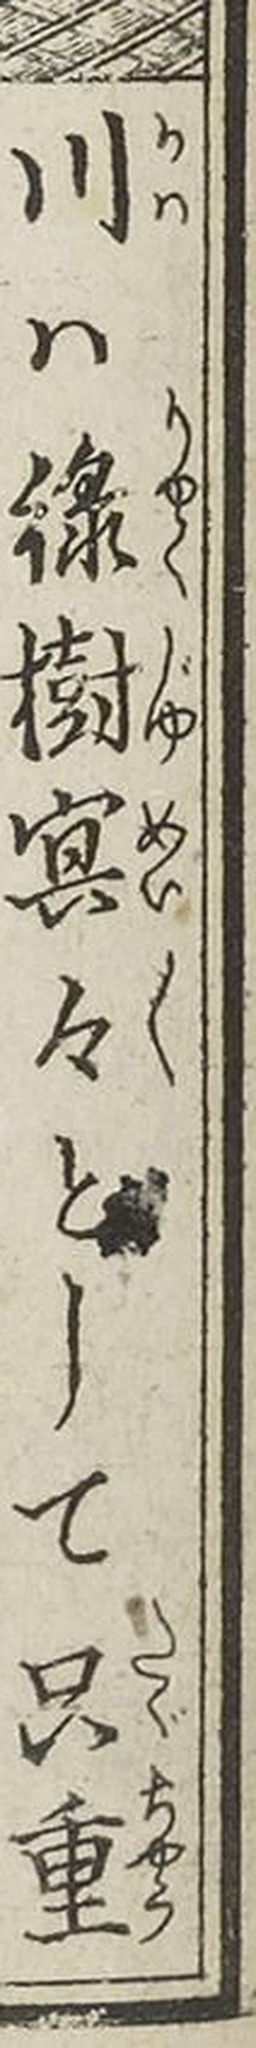川は緑樹冥々として只重
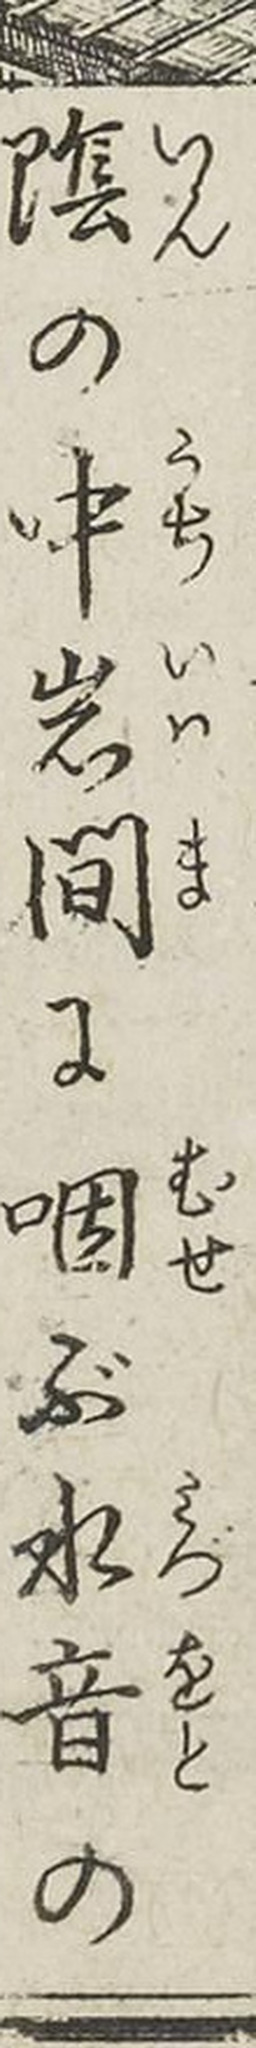陰の中岩間に咽ぶ水音の
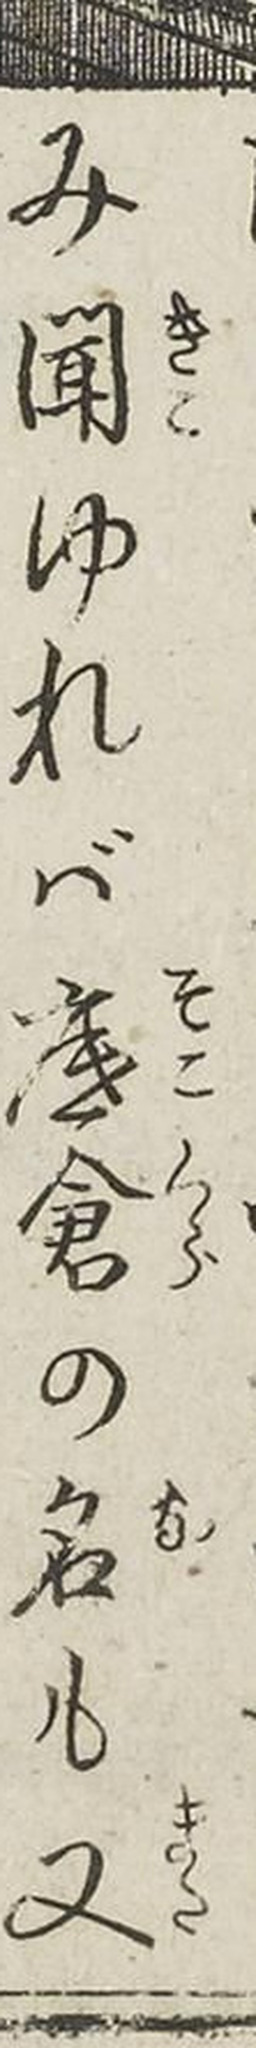み聞ゆれば浅倉の名も又
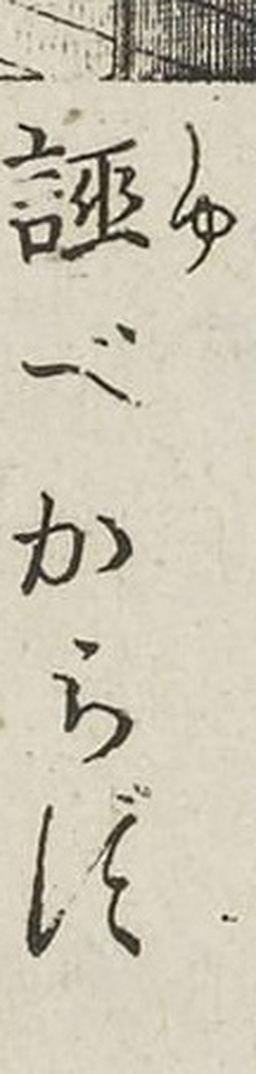誣べからず
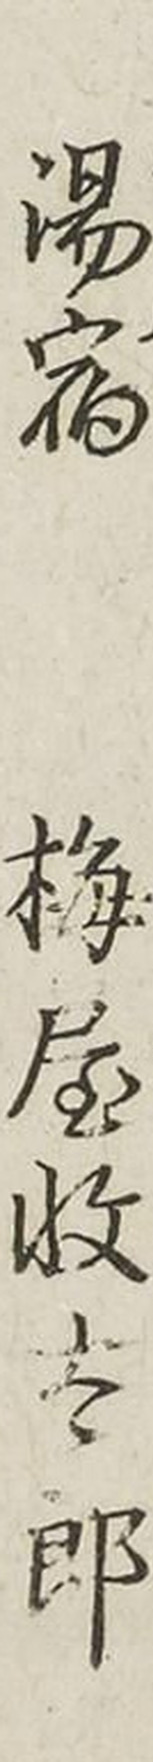湯宿梅屋収太郎
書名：箱根温泉誌　全
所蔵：東京大学地震研究所図書室 Earthquake Research Institute Library, The University of Tokyo, JAPAN
